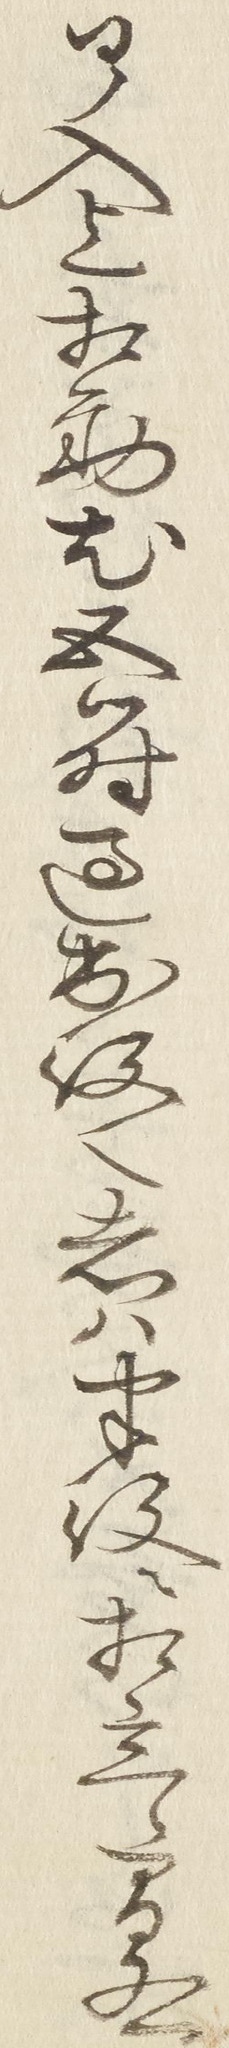日ノ入迄相勤尤五ッ時過出役之者は半役二相立候間右
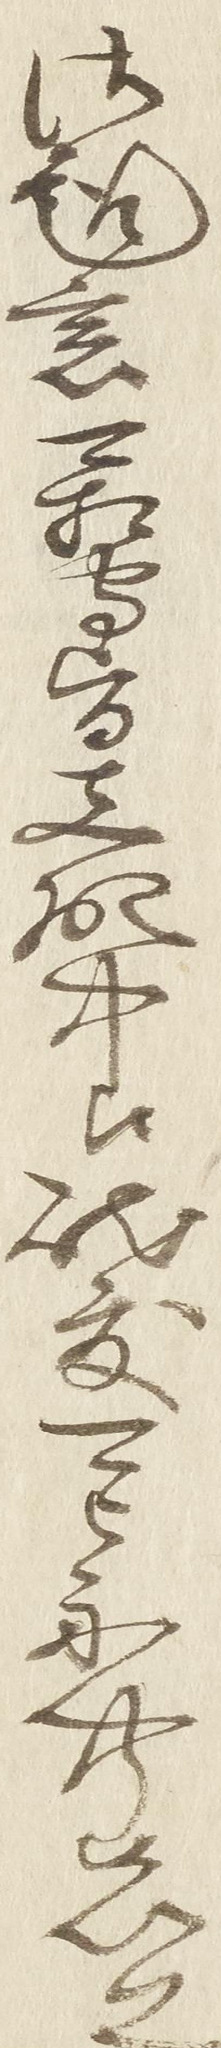御趣意可相守旨支配中江屹度可被示聞候以上
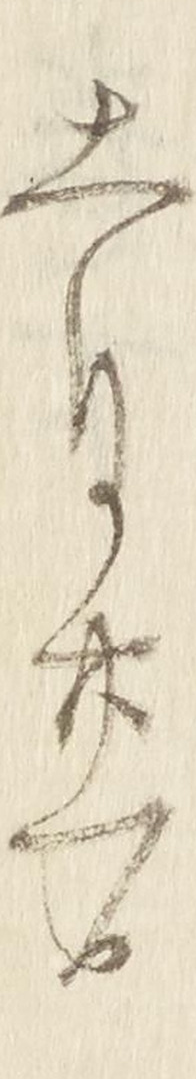十一月廿一日
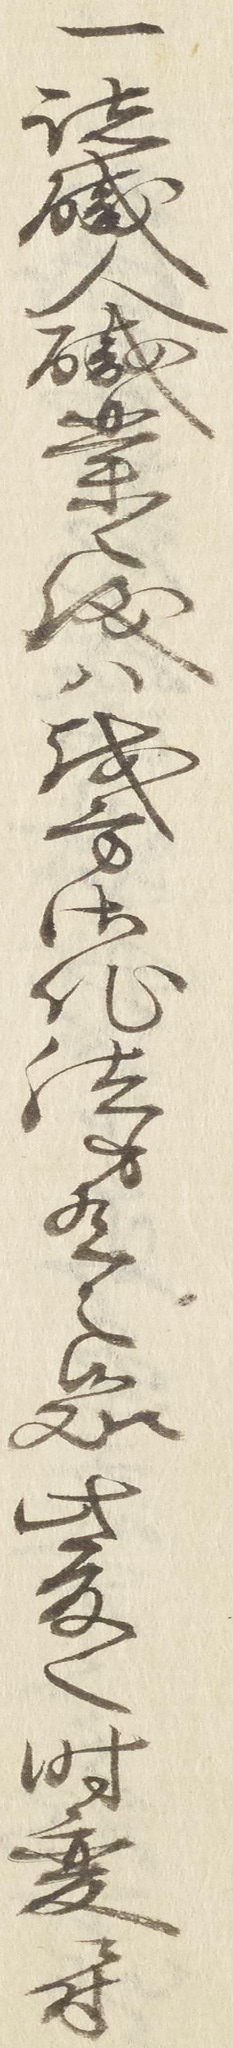一諸職人職業之儀は職方御作法も有之候処此度之時変二付
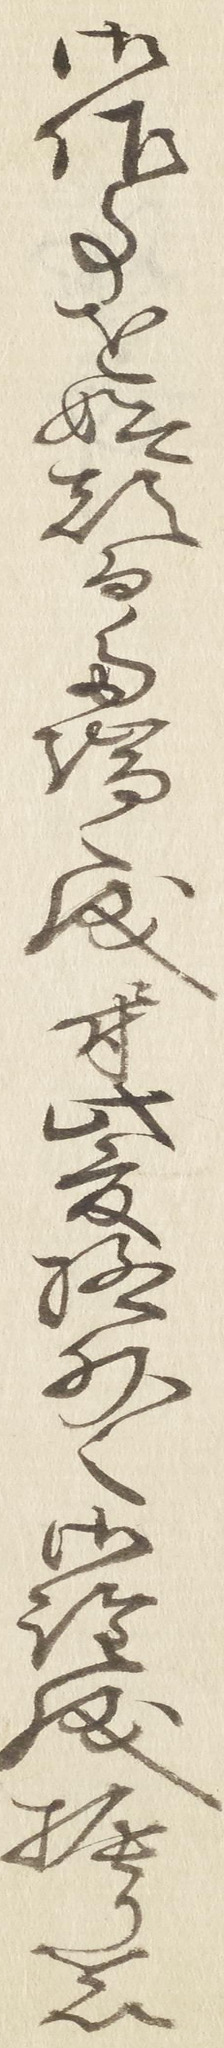御作事を始都而多端之儀二付此度格外之御跡職堀りを以
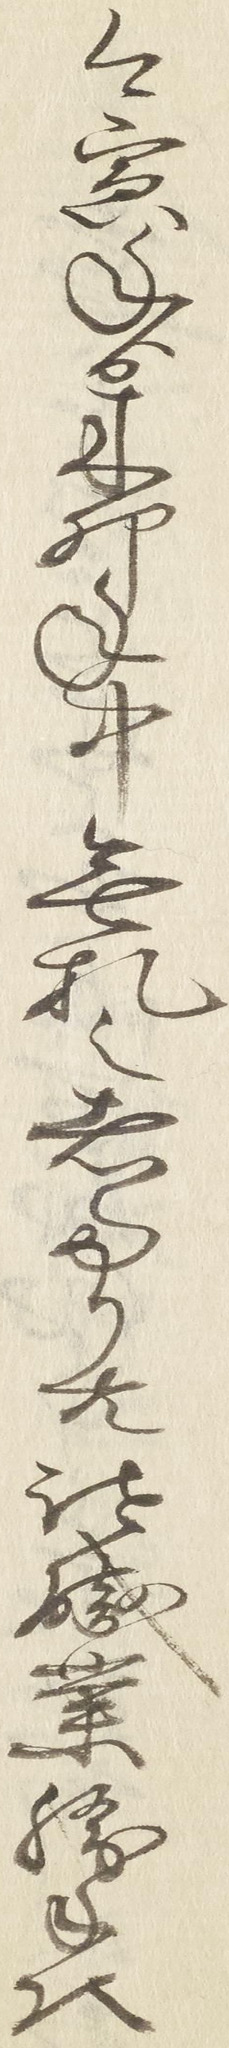今寅年ゟ來卯年中無札之者たり共諸職業勝手次
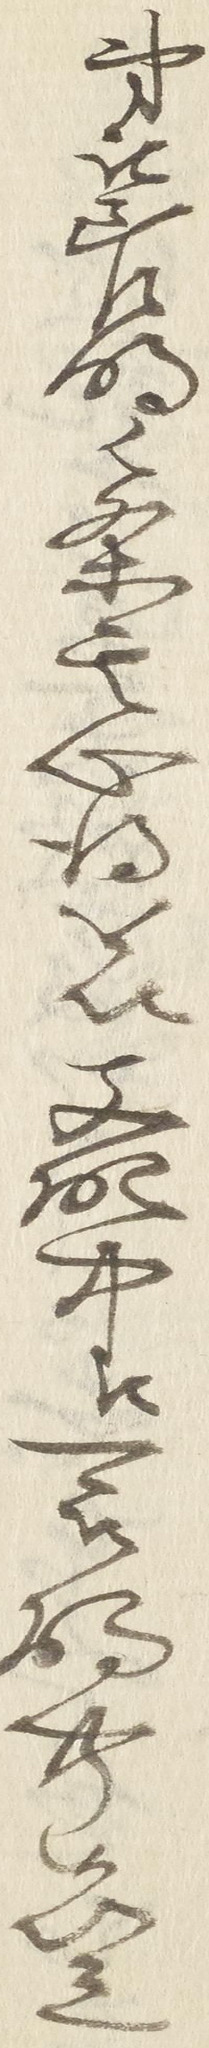第被差触候条其心得を以支配中江可被触聞候以上
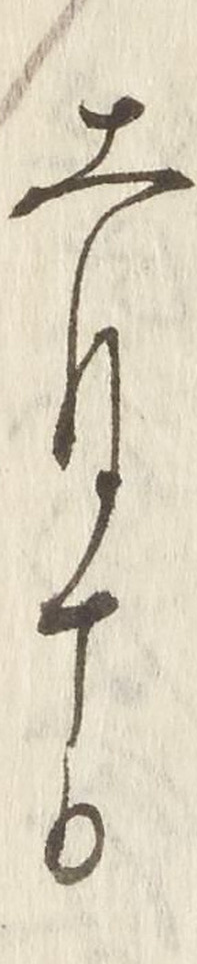十一月十日
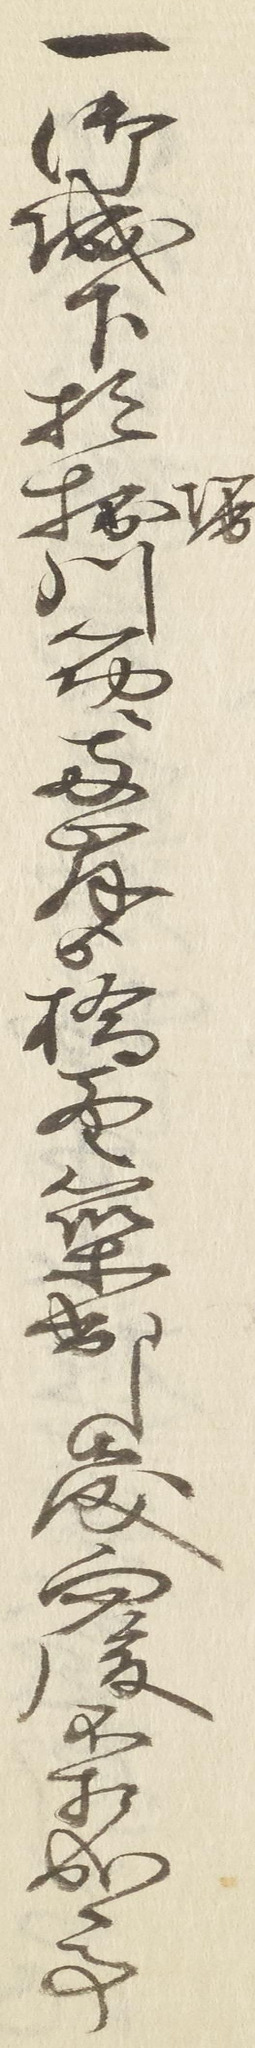一御城下於堀川筋二両岸ゟ橋台築出し候儀向後不相成候事
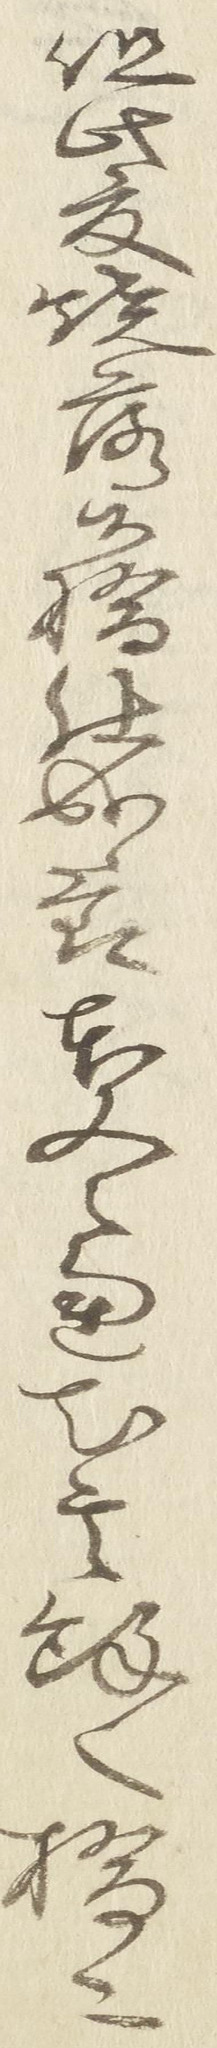但此度焼落候橋仕成候節本文之通尤其所之橋々
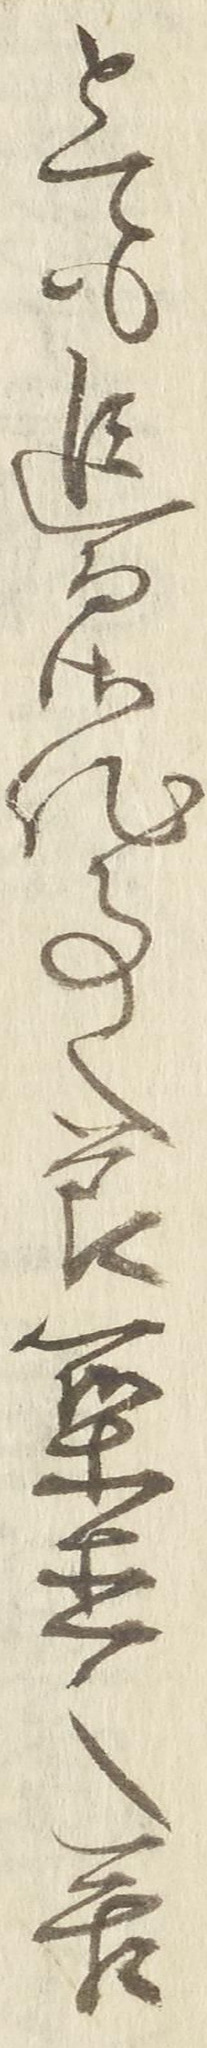とても追而御作事之節築置之筈

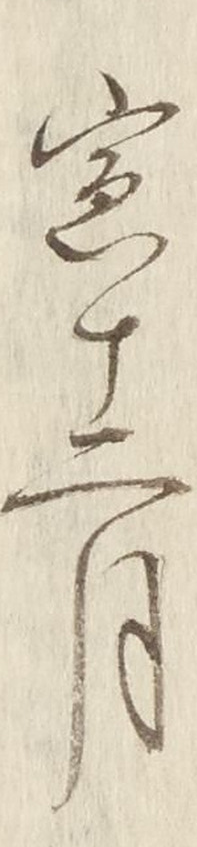寅十二月
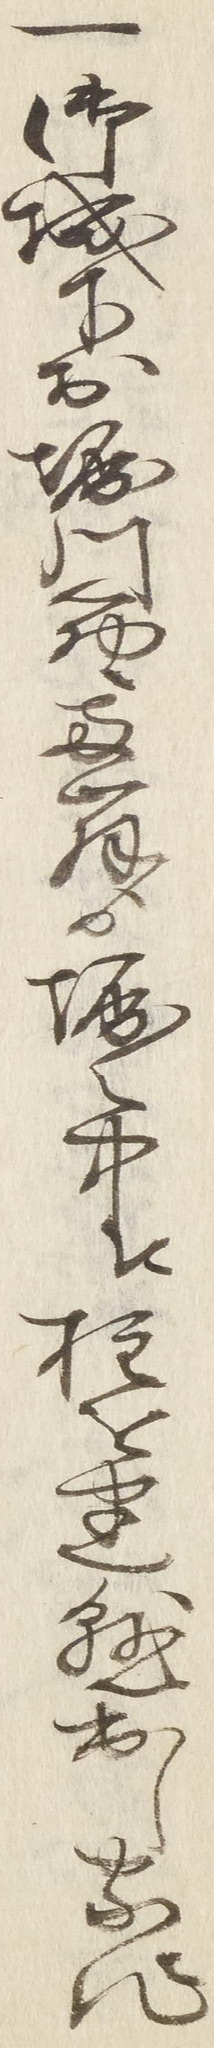一御城下於堀川筋両岸ゟ堀之中江柱を建懸出し家作
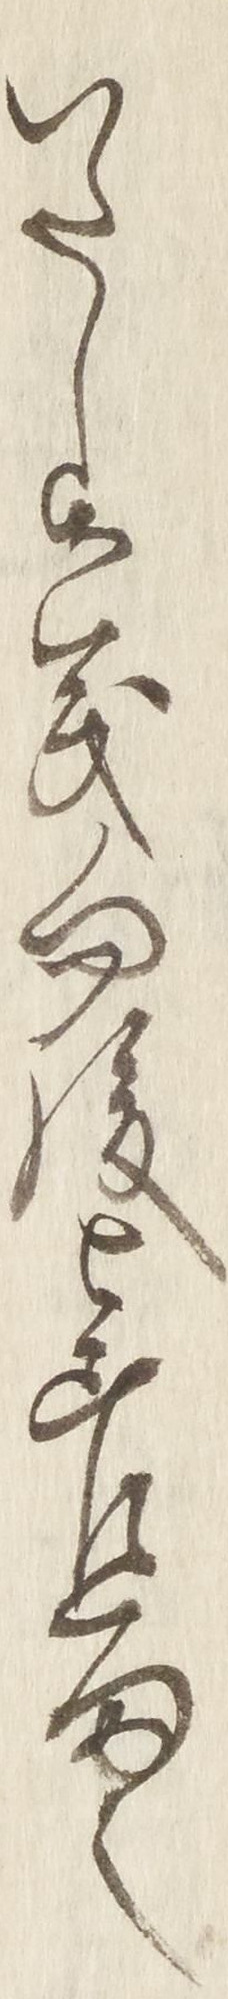いたし候義向後被差留之
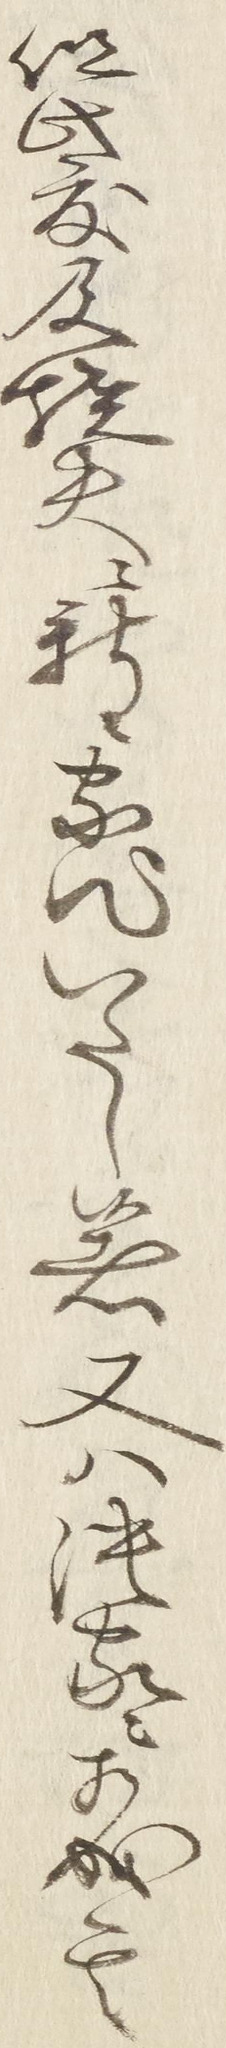但此度及焼失新に家作いたし候者又は潰家に相成其
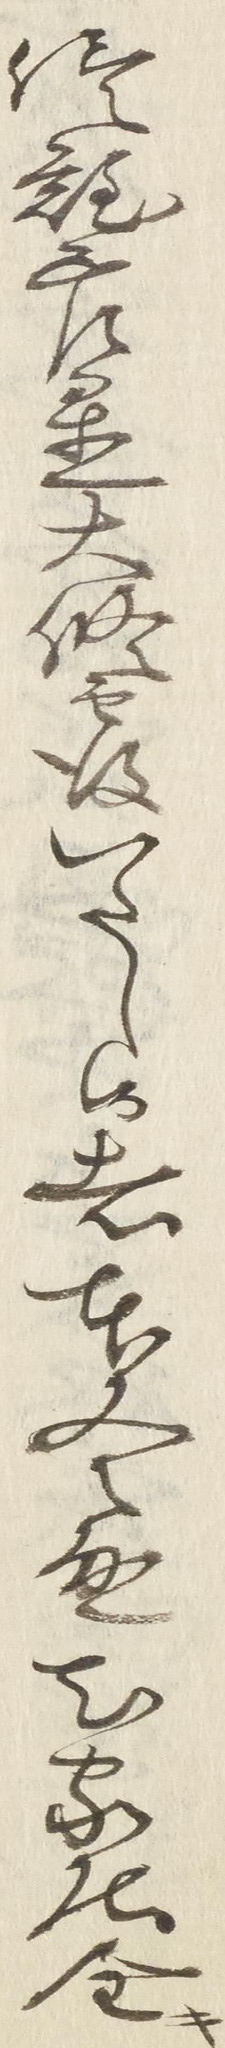儘難差置大修覆いたし候者本文之通尤家居全キ
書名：地震記　下
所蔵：東京大学地震研究所図書室 Earthquake Research Institute Library, The University of Tokyo, JAPAN
